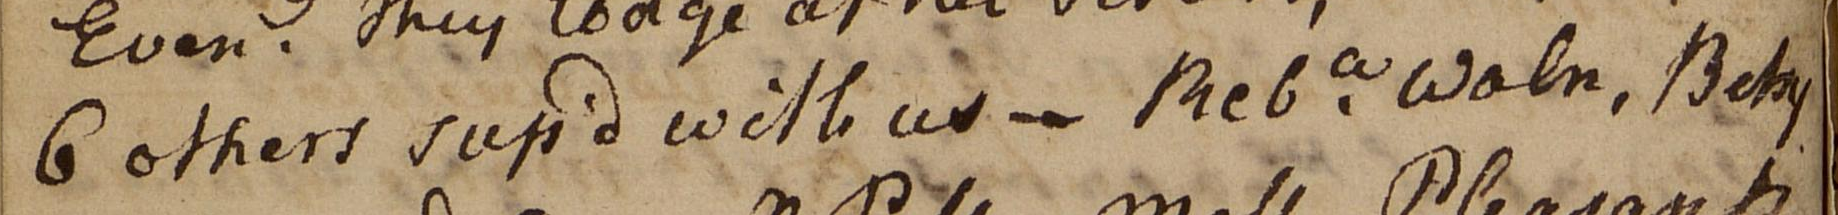6 others sup'd with us- Reb^a. Waln, Betsy
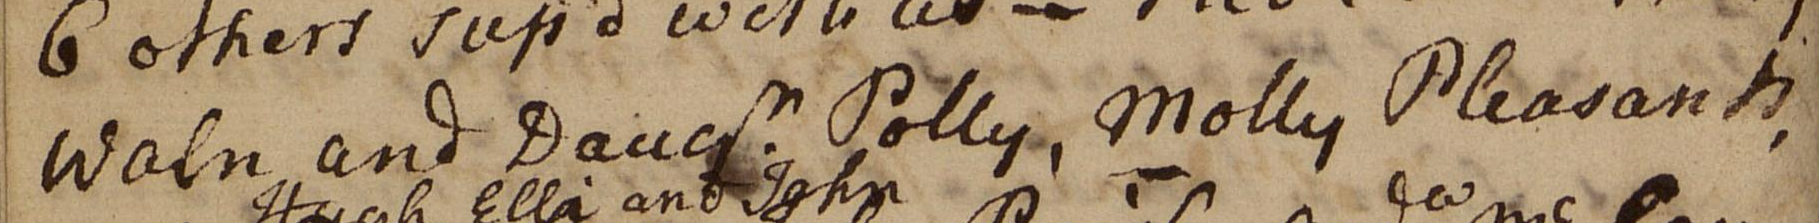Waln and Daug^r. Polly, Molly Pleasants,
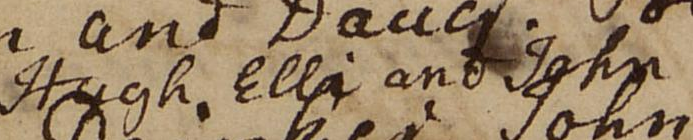Hugh, Elli and John
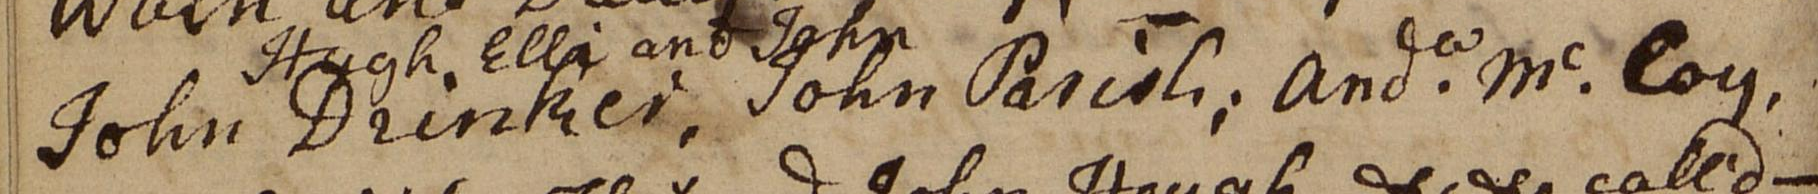John Drinker, John Parish; And.^w M^c. Coy,
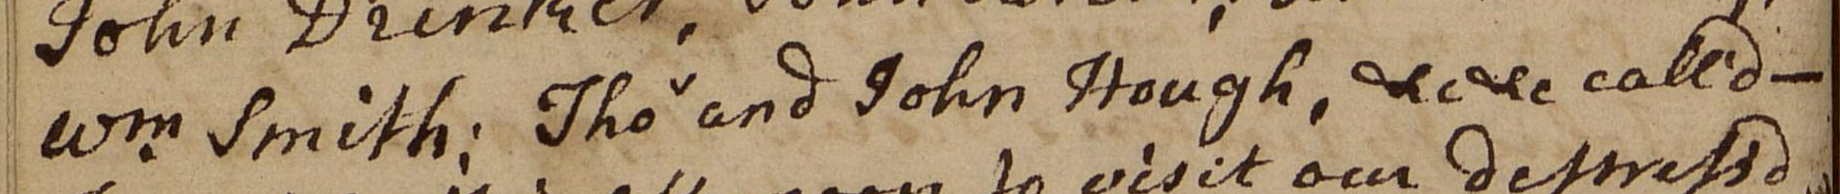W^m Smith; Tho^s and John Hough, &c &c call'd-
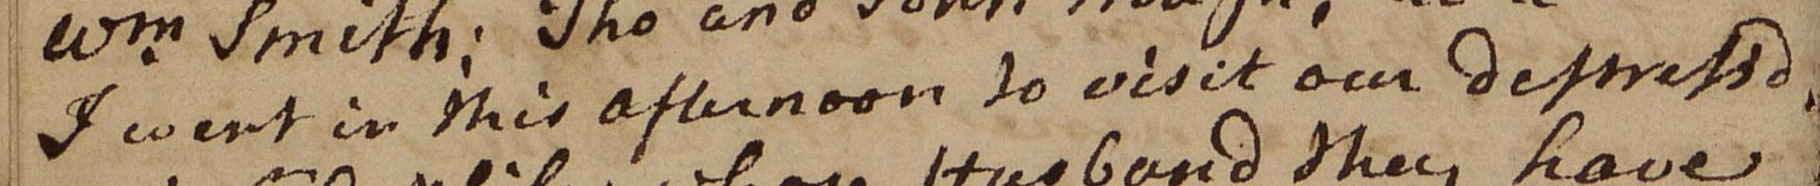I went in this aftermoon to visit our depress'd
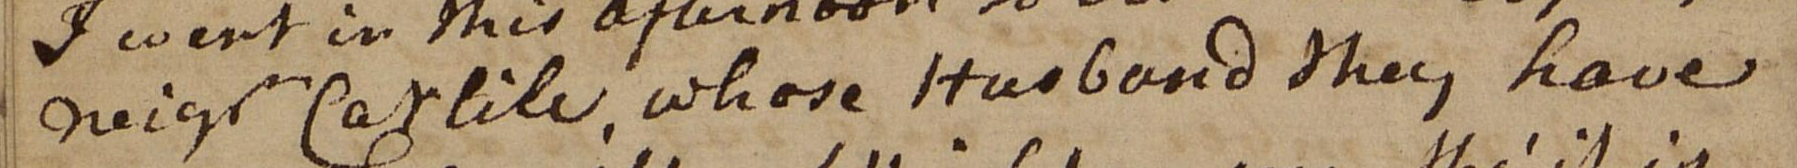Neig^r Carlile whose Husband they have
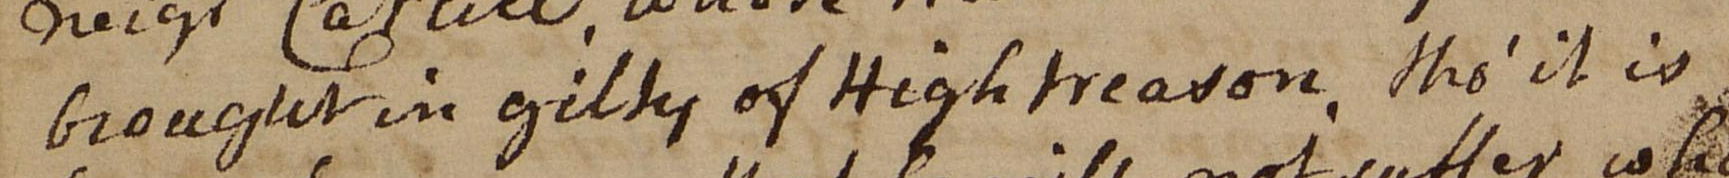brought in gilty of High treason, tho' it is
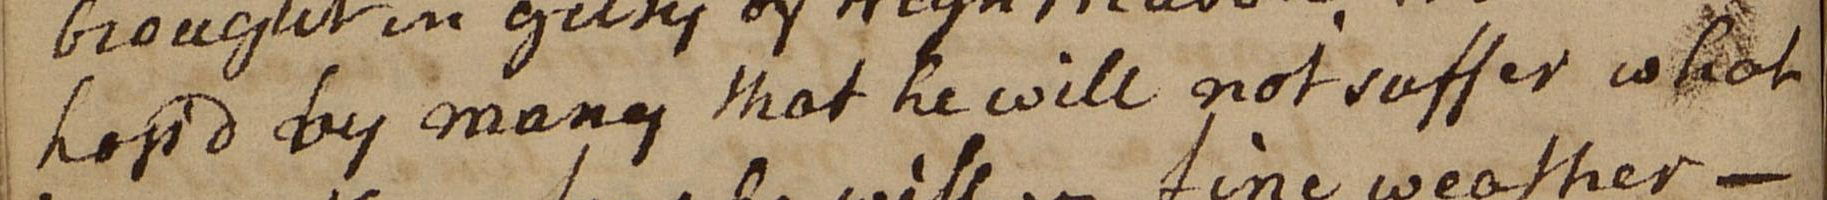hop'd by many that he will not suffer what
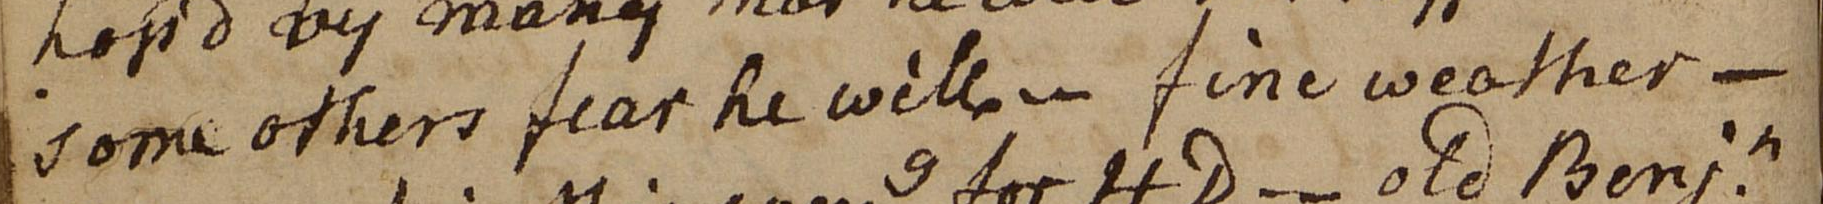some others fear he will- fine weather-
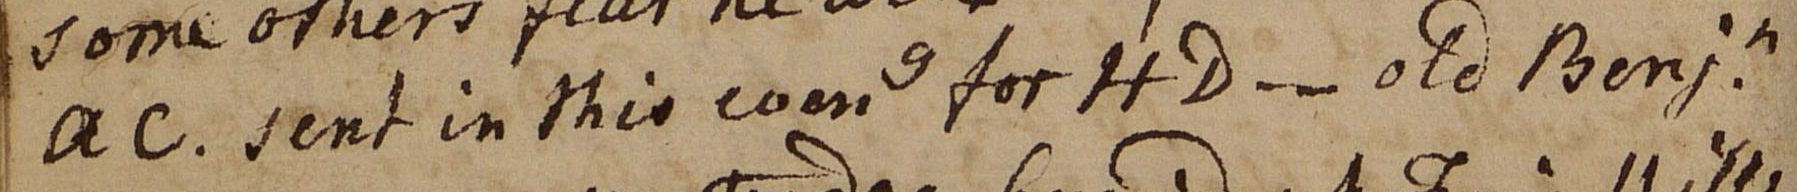AC. sent in this even^g for HD- old Benj^n.
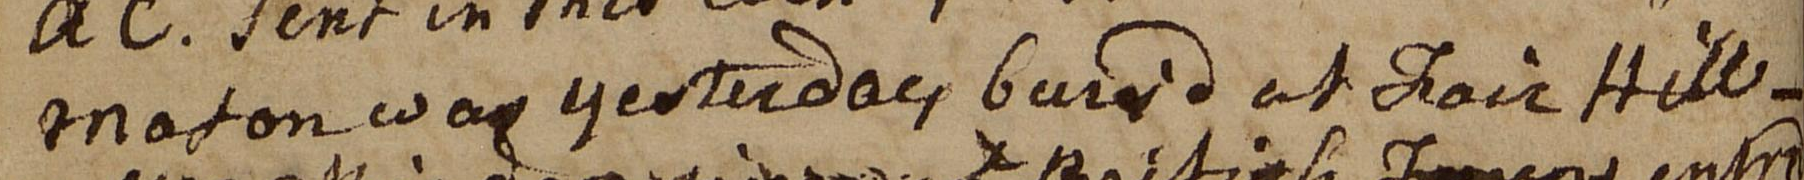Mason was yesterday bury'd at Fair Hill-
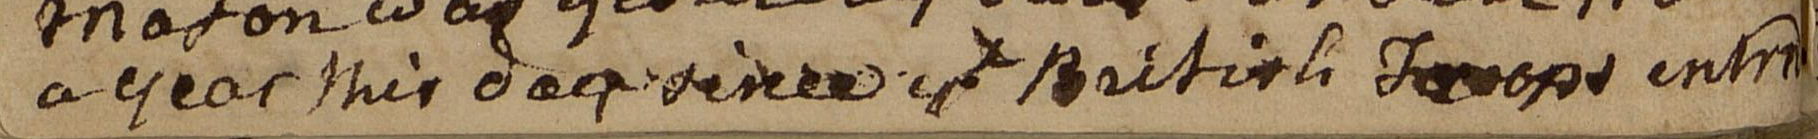a year this day since y^e British Troops entre
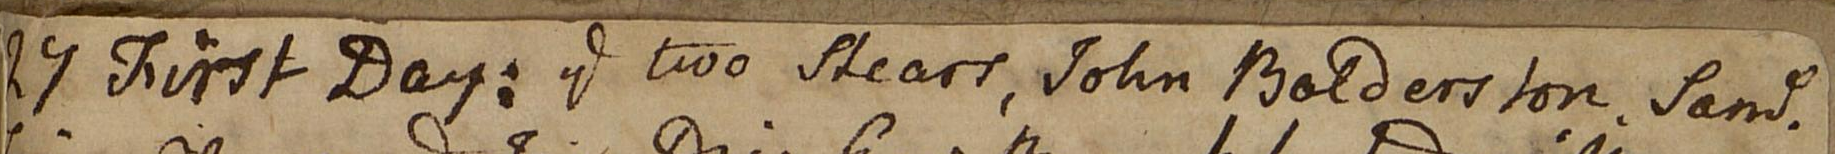27 First Day: y^e two Stears, John Bolderston, Sanm^s
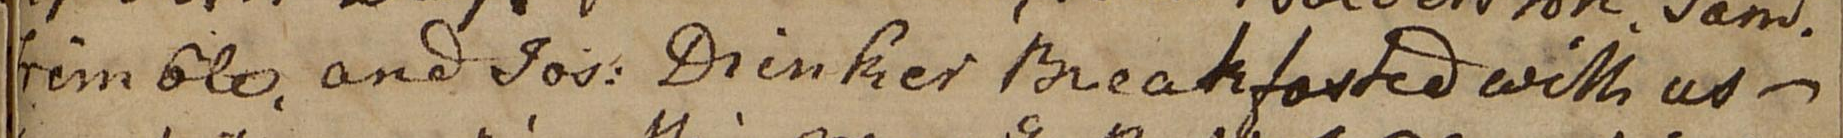[b]imble and Jos: Drinker Breakfasted with us-
